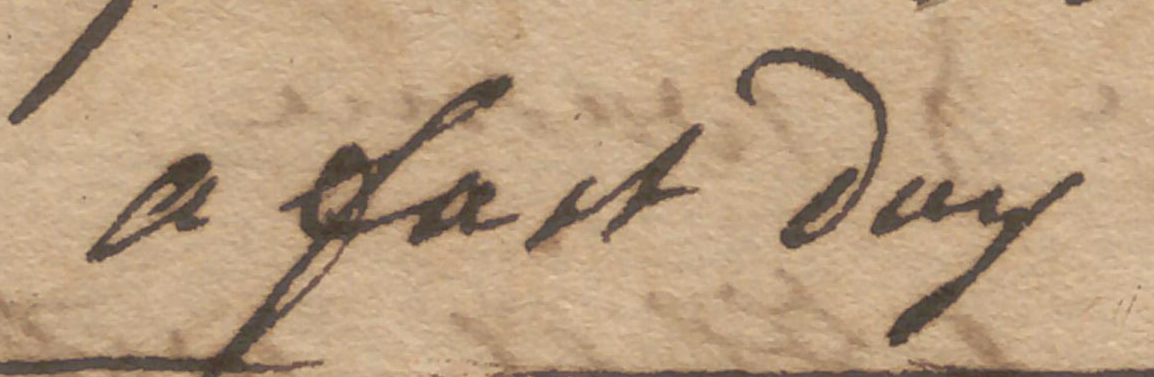a fast day
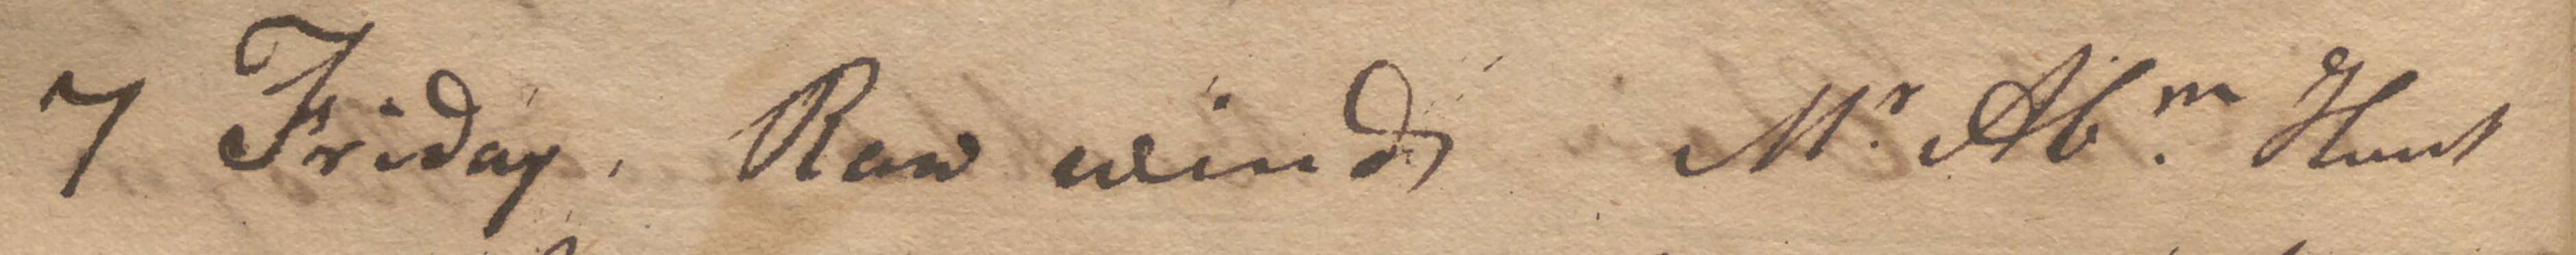7 Friday. Raw winds M^r. Ab^m. Hunt
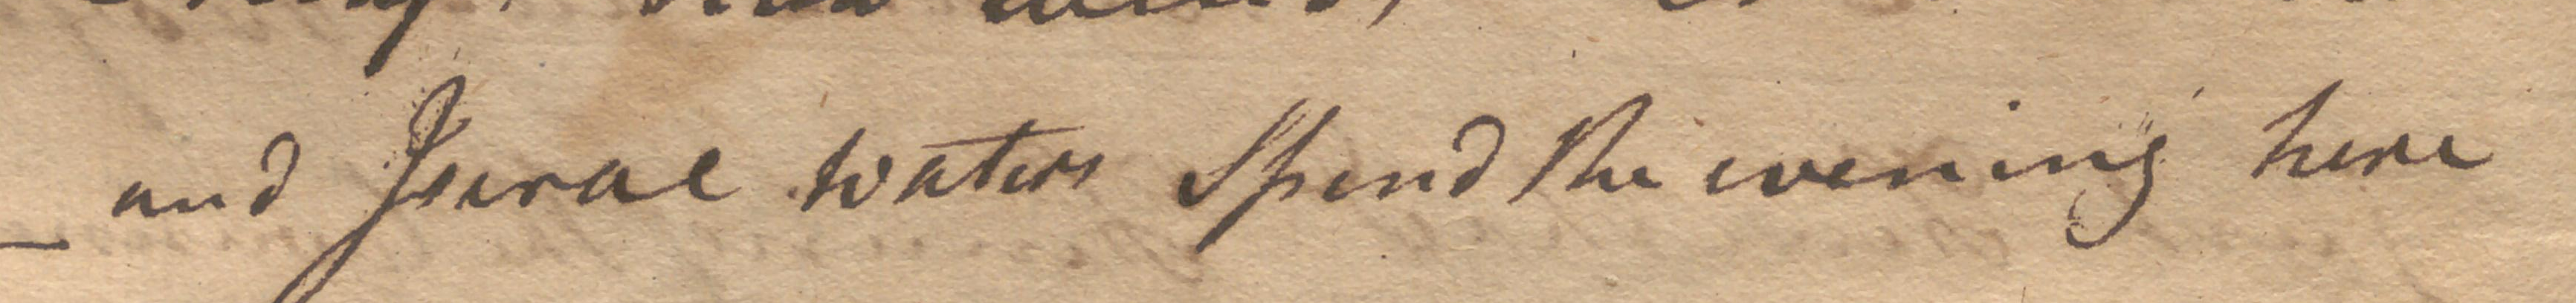and Iseral waters spend the evening here
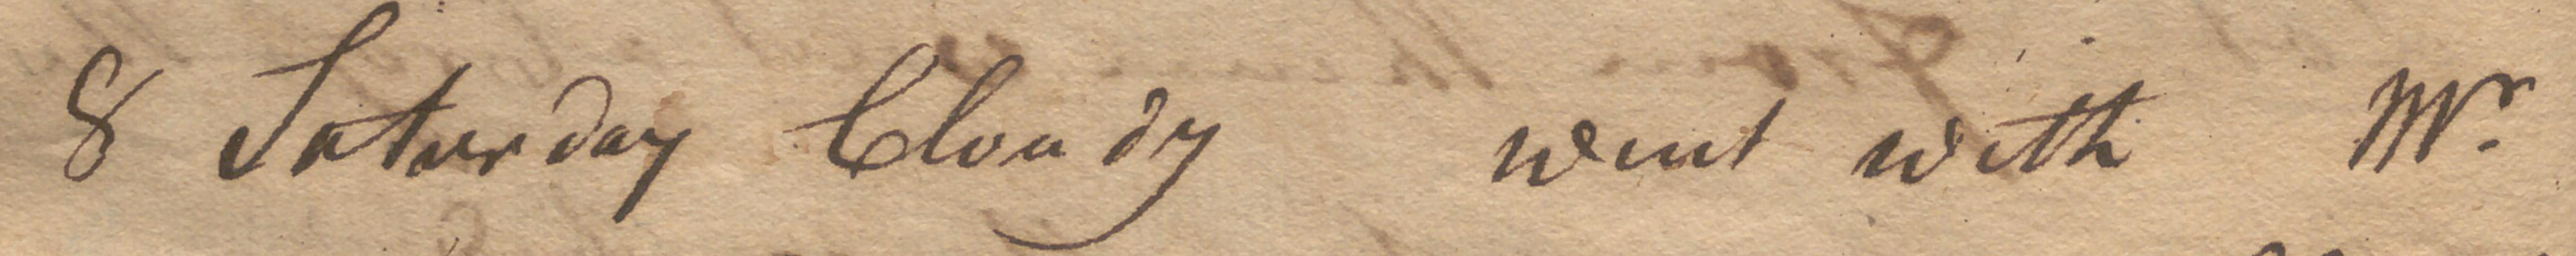8 Saturdey Cloudy went with M^r.
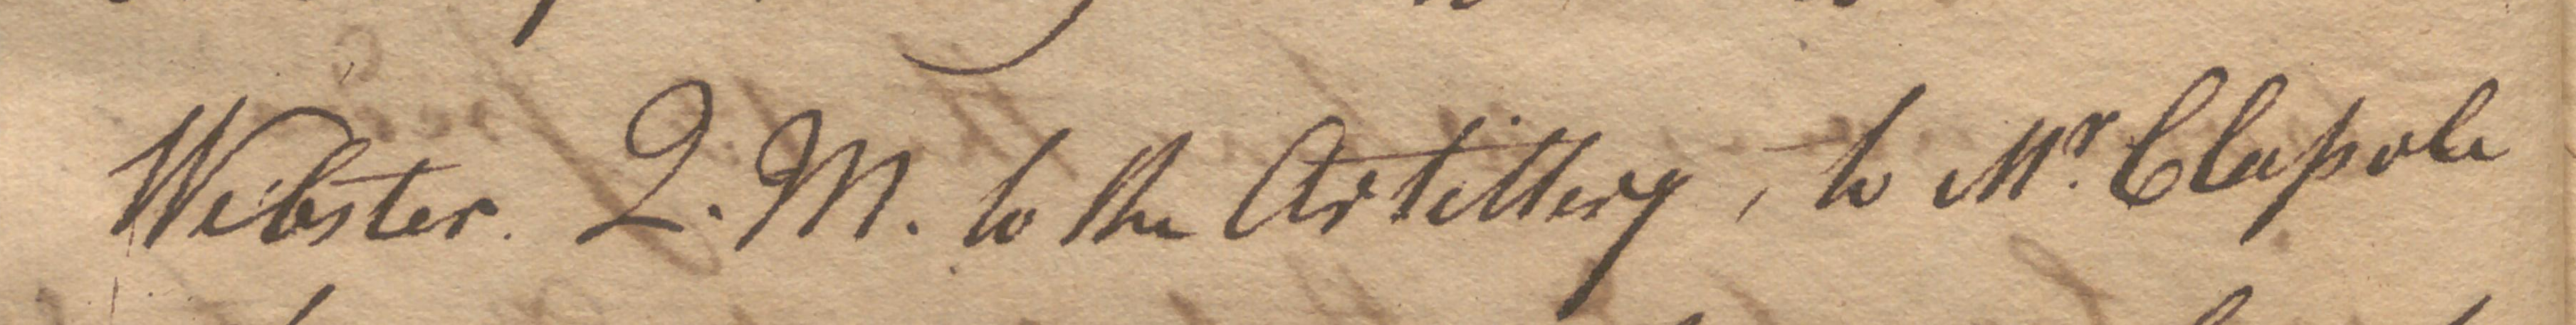Webster. Q. M. to the Artillery, to M^r. Clapole
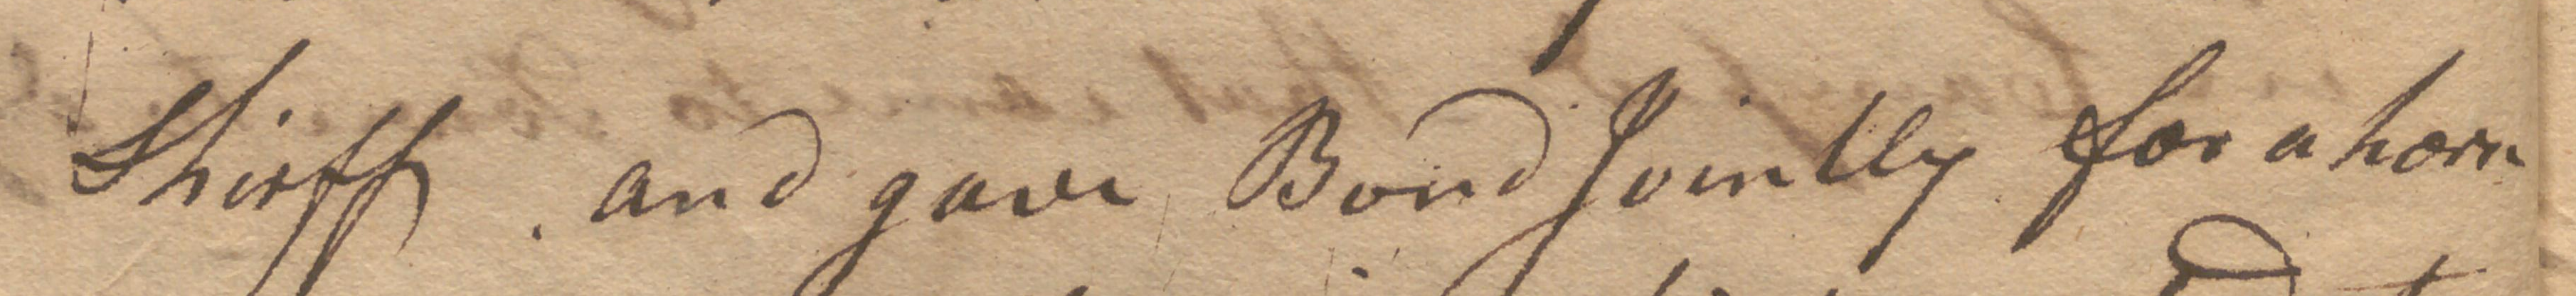Shirff, and gave Bond Jointly for a horse
